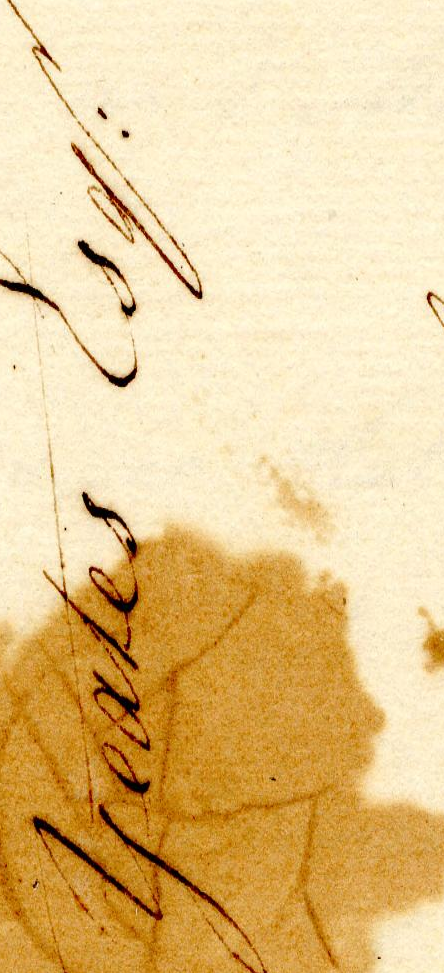Yeates Esq^r:
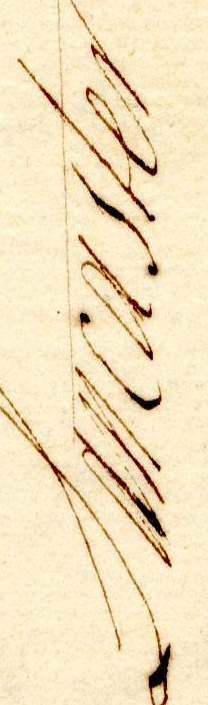Lancaster
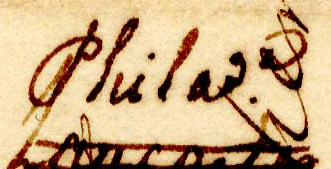Philad^a.
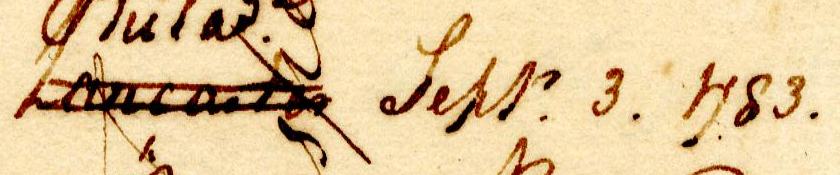[Lancaster] Sept^r. 3. 1783.
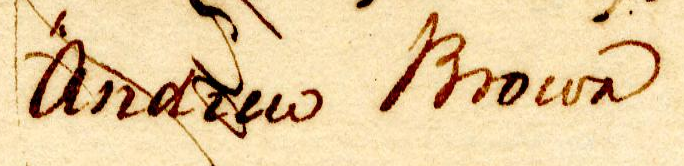Andrew Brown
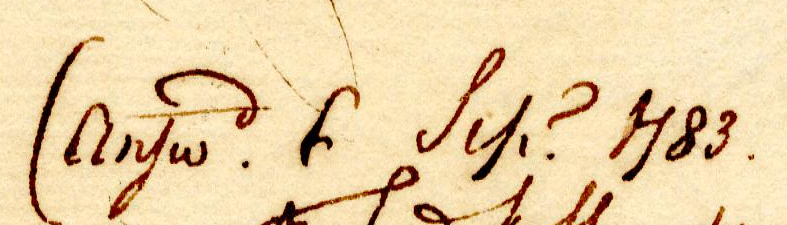(Answ^d. 6 Sep^r. 1783.
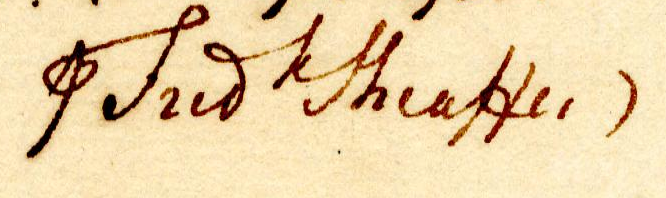Per Fred^k Sheaffer)
